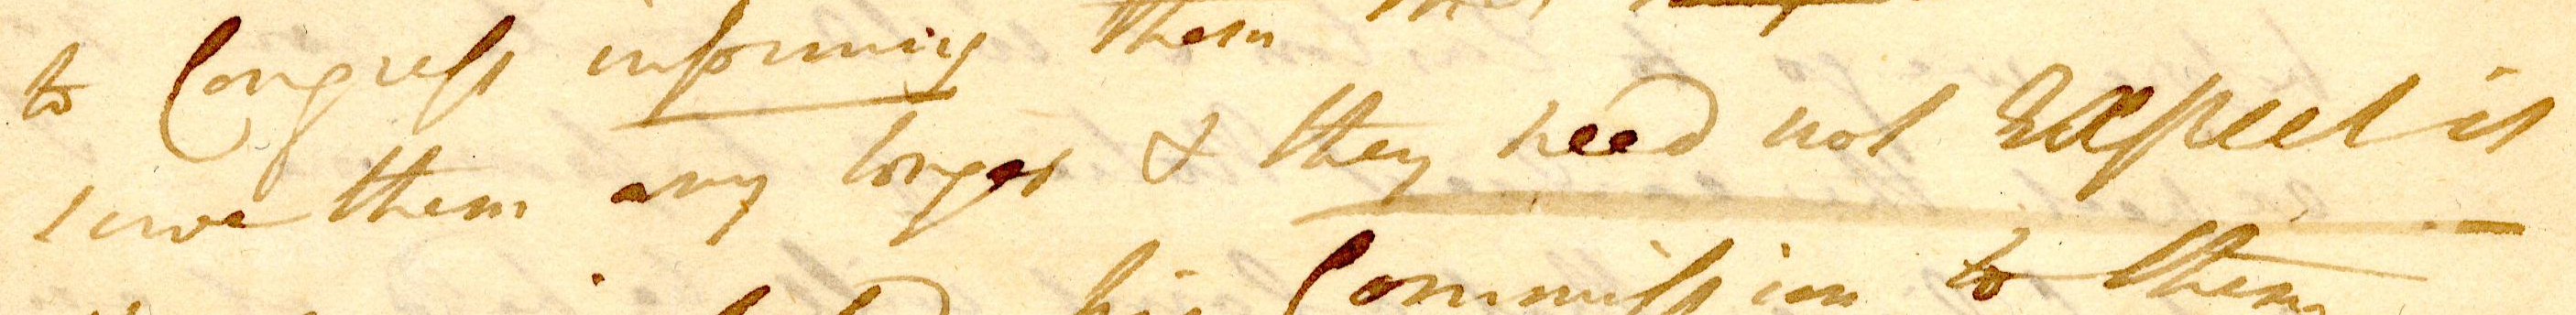serve them any longer & they heed not expect it
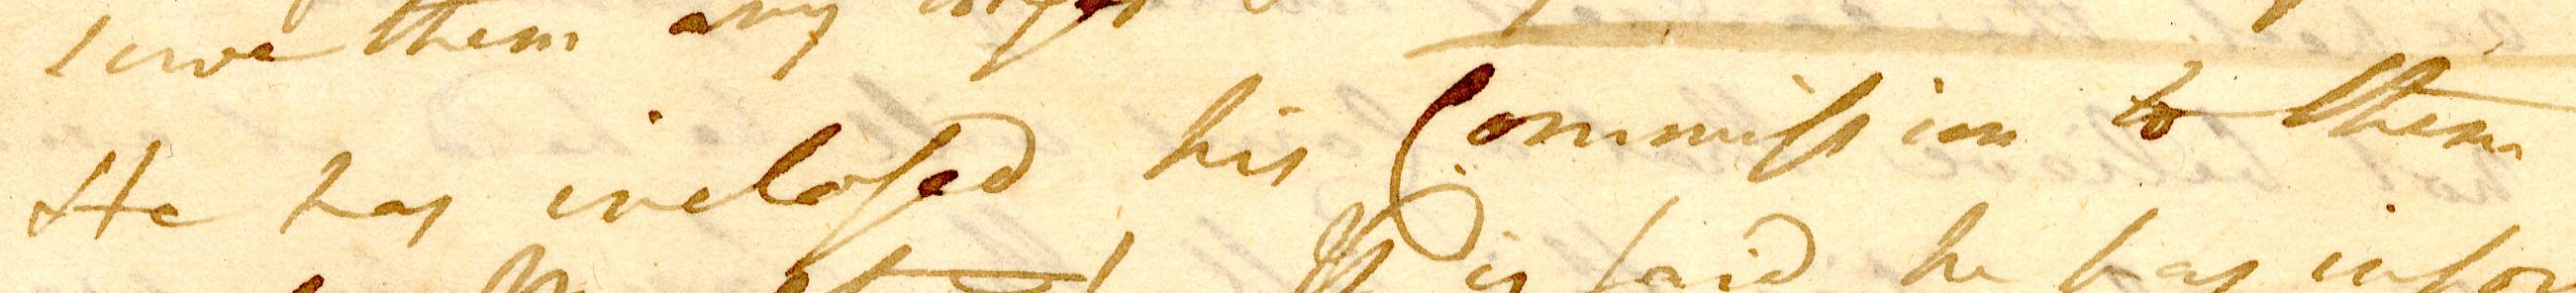He has inclosed his Commission to them
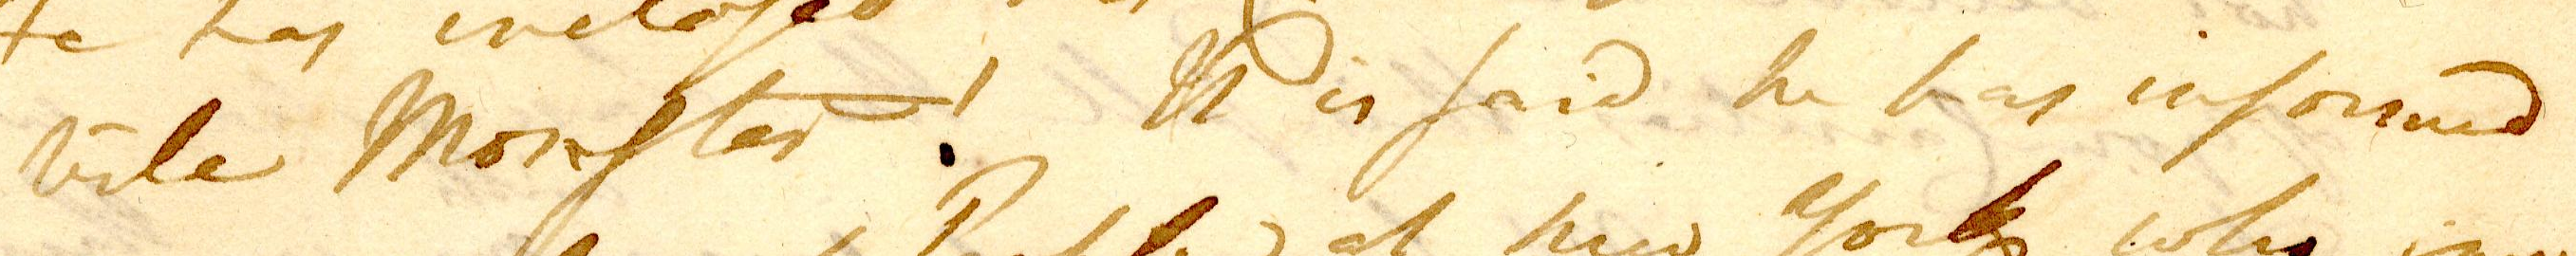vile Monsters! It is said he has informed
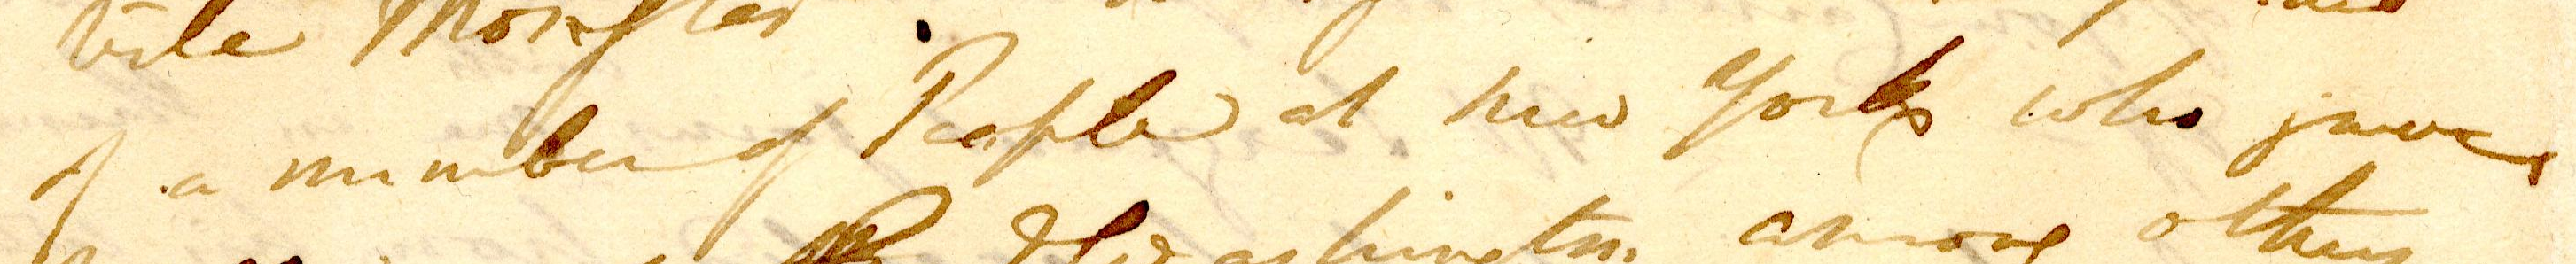of a member of People at New York who gave
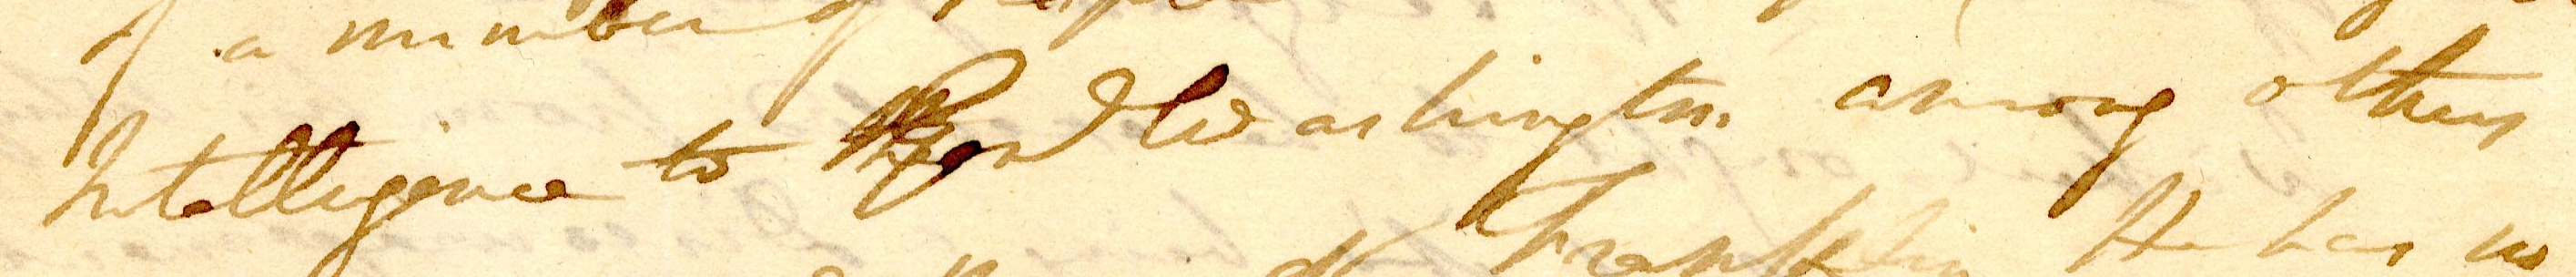Intelligence to Gen^l. Washington among others
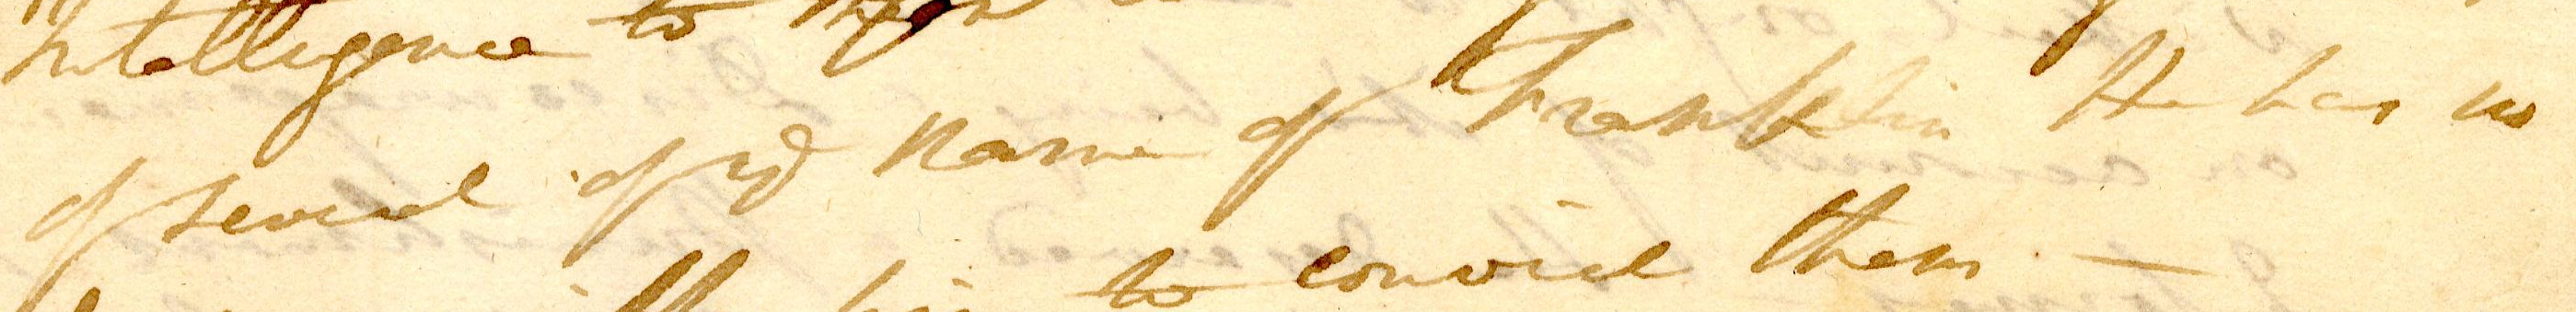of several of y^e Name of Frank He has no
